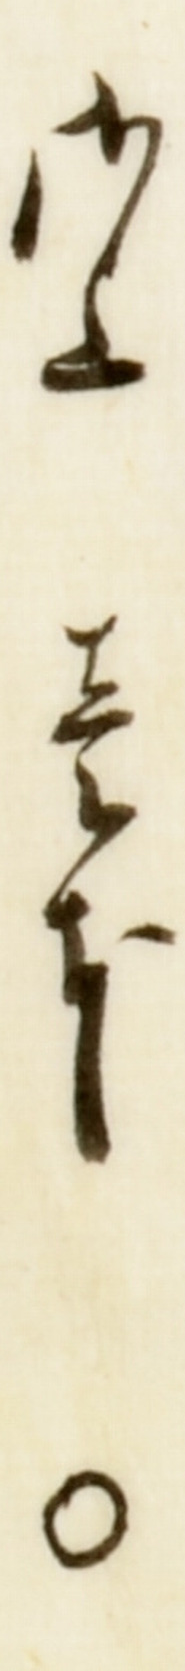御上壱本○
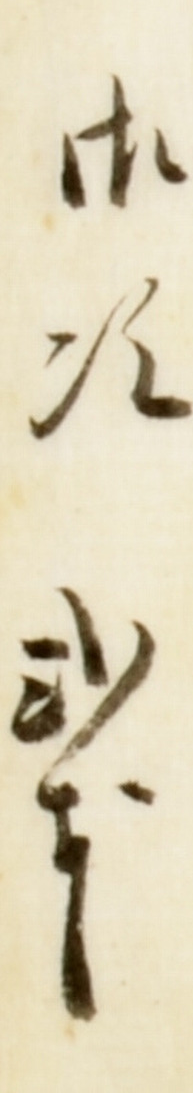御次弐本

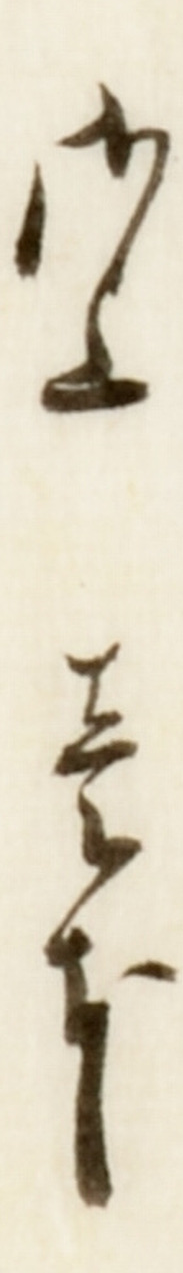御上壱ツ
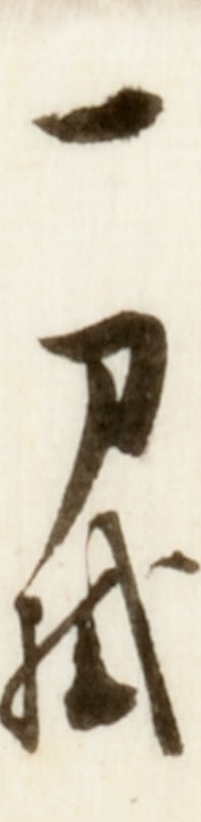一刀掛
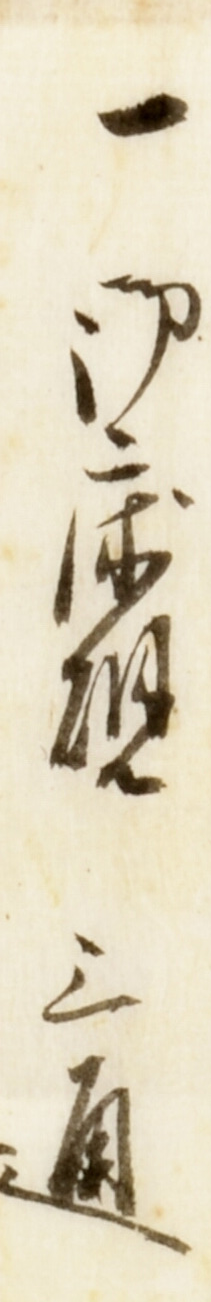一御床硯三通
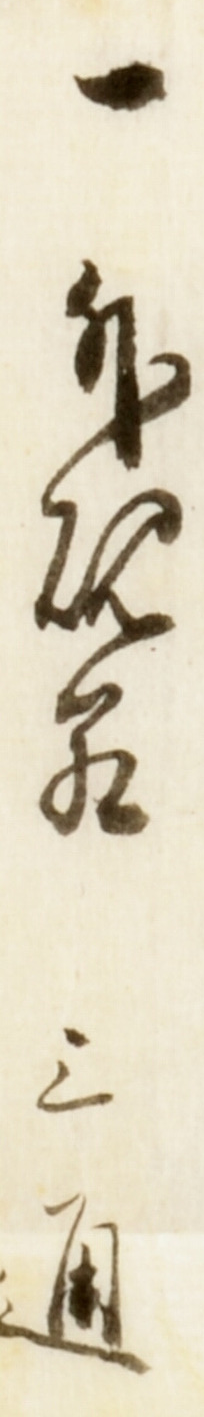一外硯箱三通
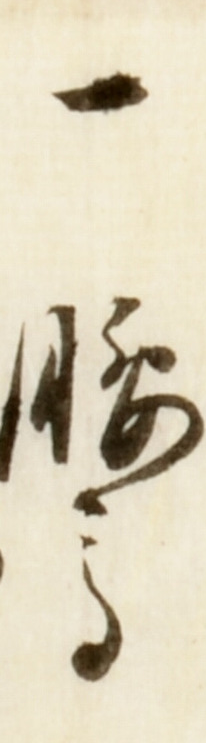一腰高
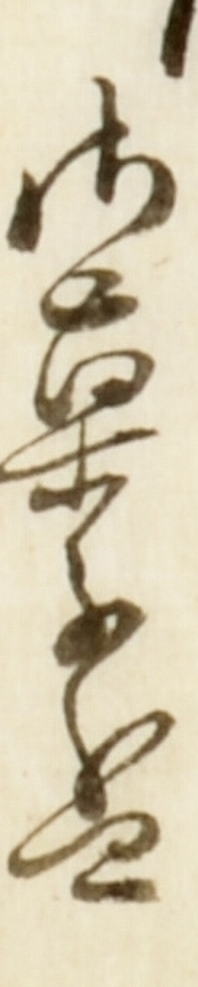御菓子盆
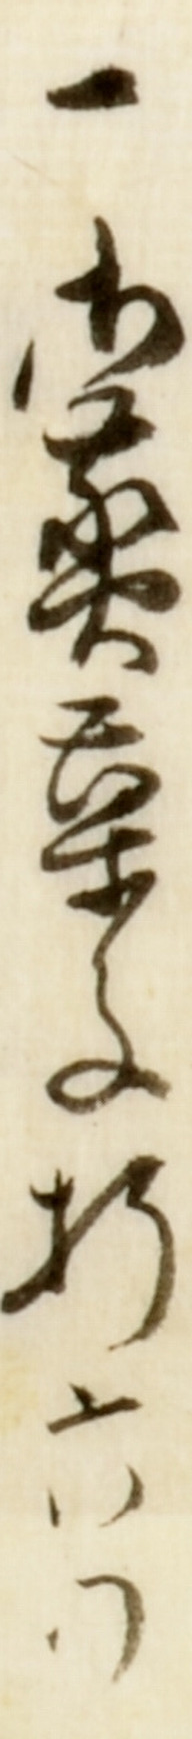一御蒸菓子折六ツ
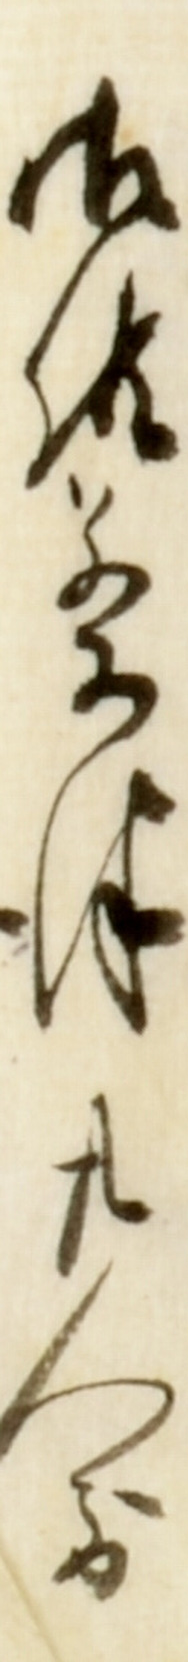御供茶休廿人前

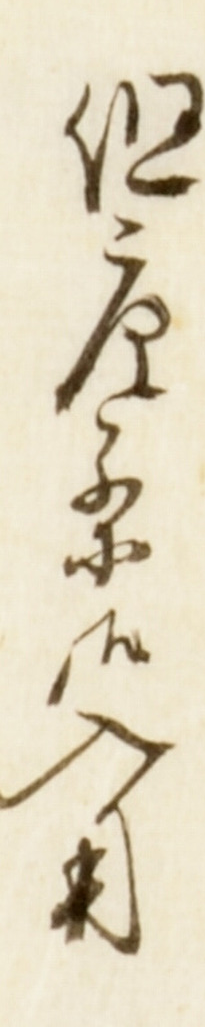但唐茶御入用
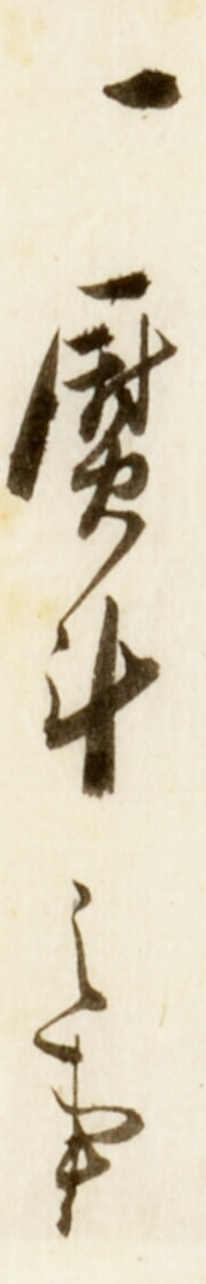一熨斗之事
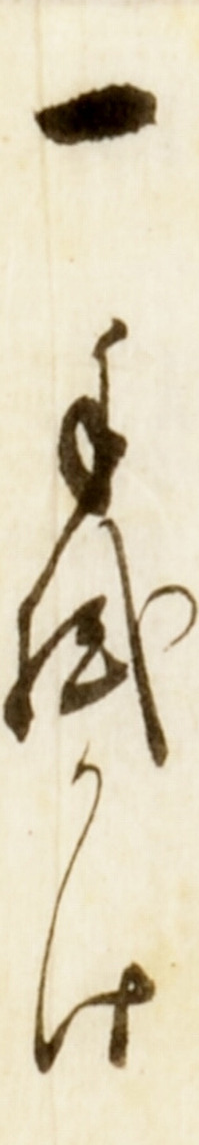一手拭かけ
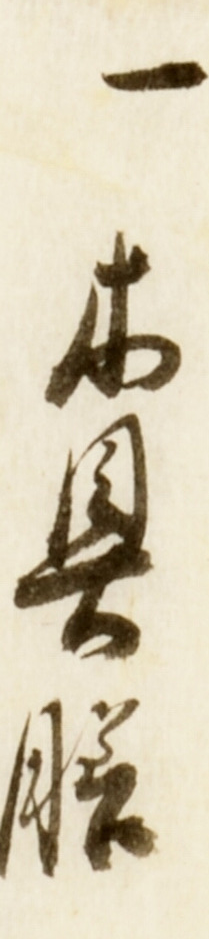一木具膳
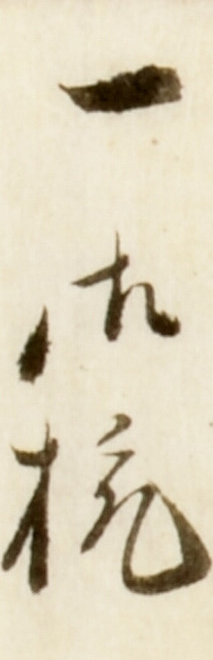一御椀
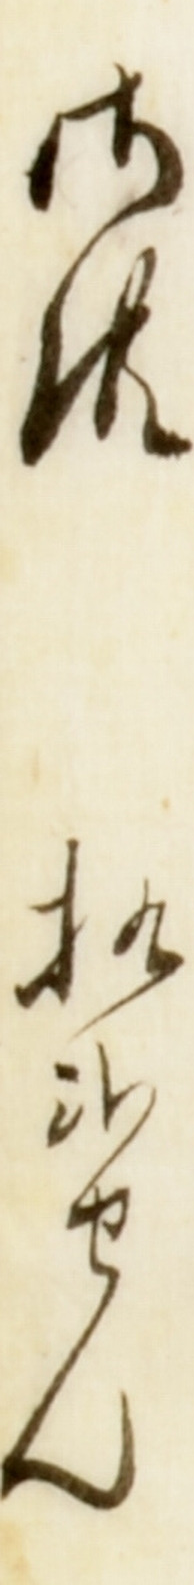御供拾弐せん
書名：覚
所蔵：伊那市立高遠町図書館・合同会社AMANE
